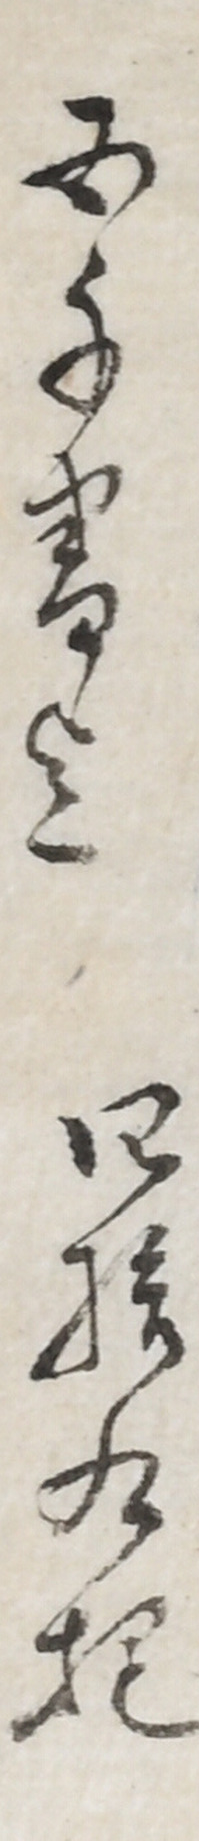五千番迄四拾九把
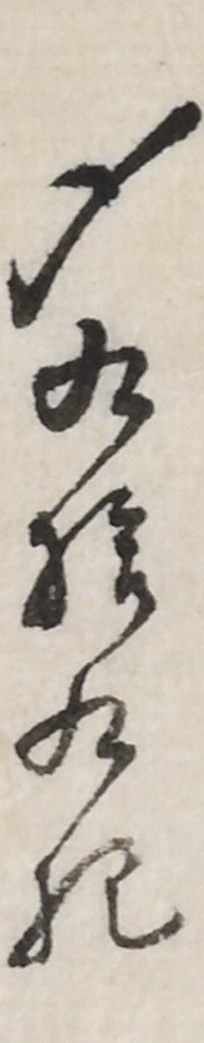〆九拾九把
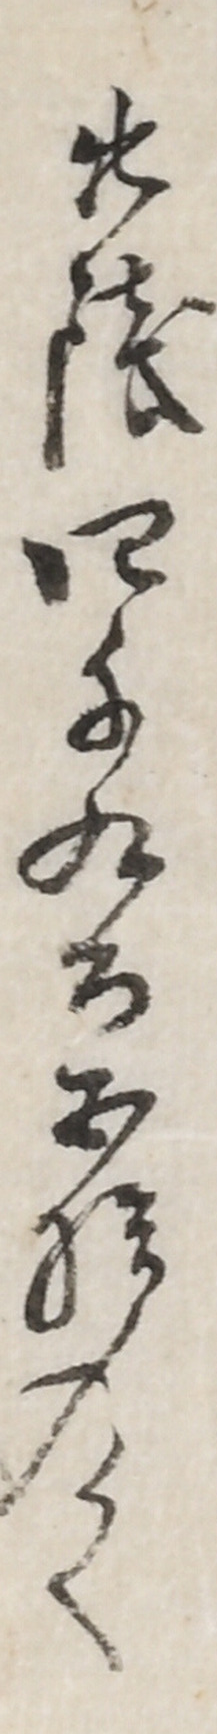此銭四千九百五拾〆文
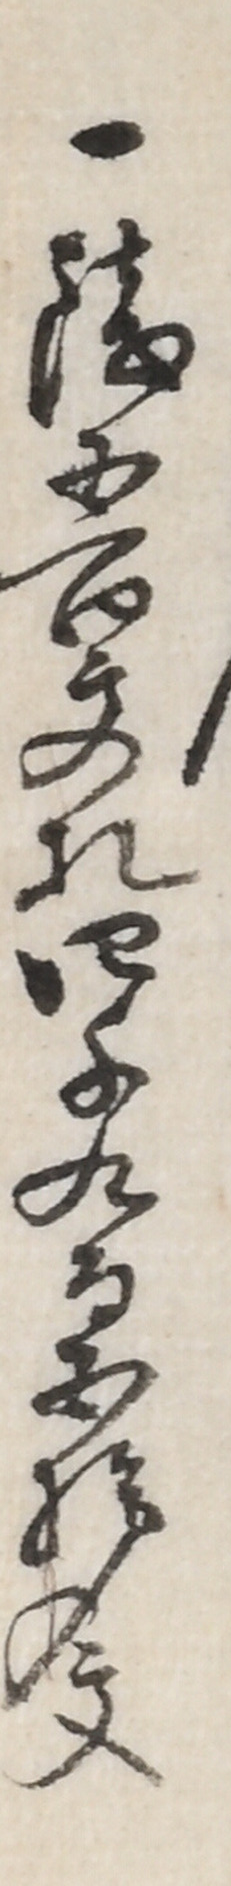一銭五百文札四千九百五拾〆文
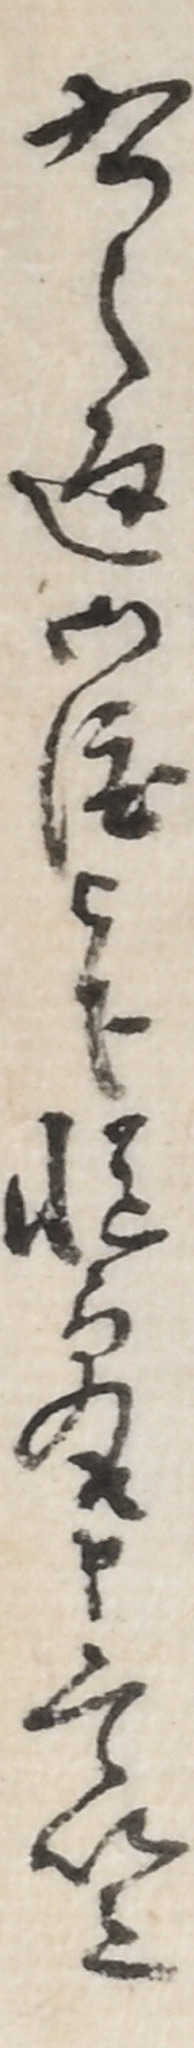右之通御渡被下慥受取申上候以上
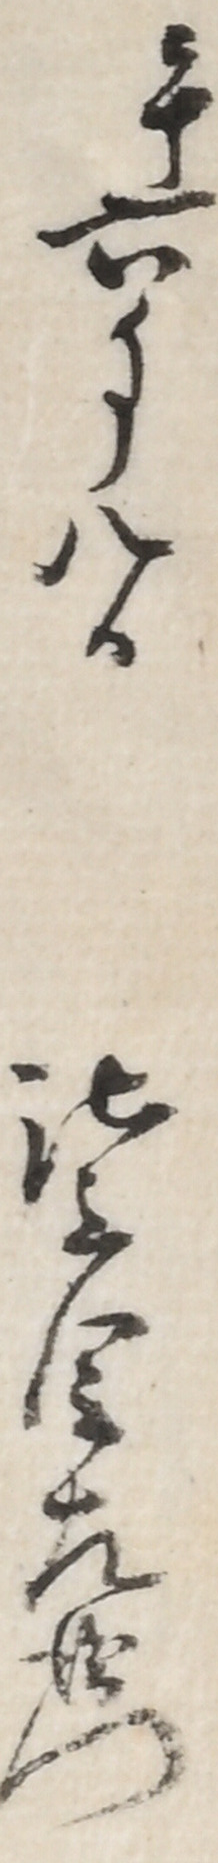午六月八日池上金左衛門
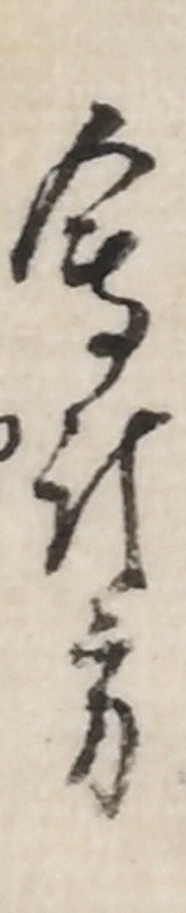会計方
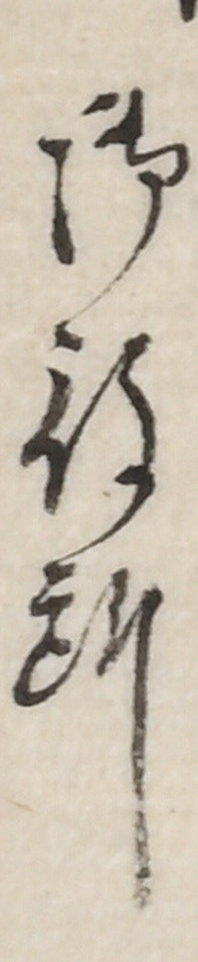御役所
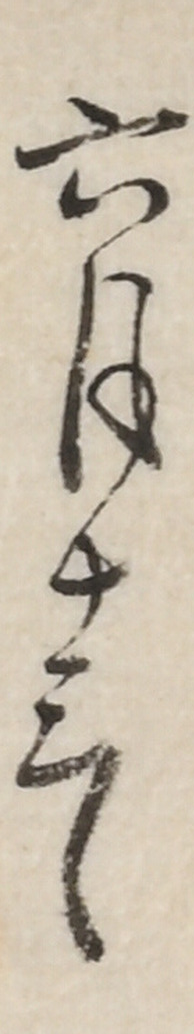六月十三日
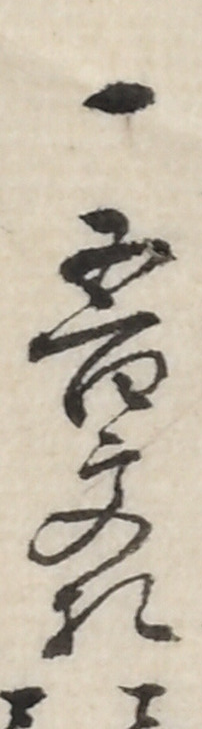銭五百文札

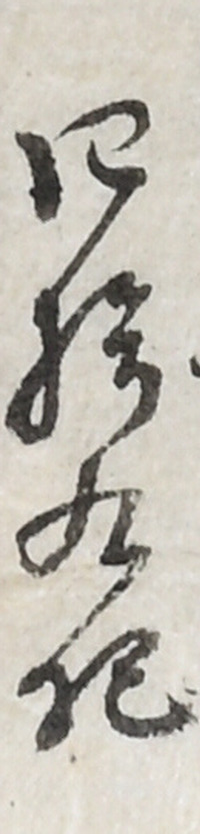四拾九把
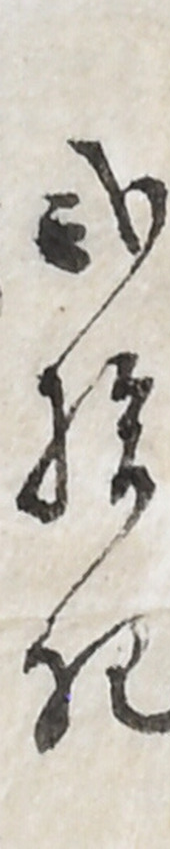弐拾把
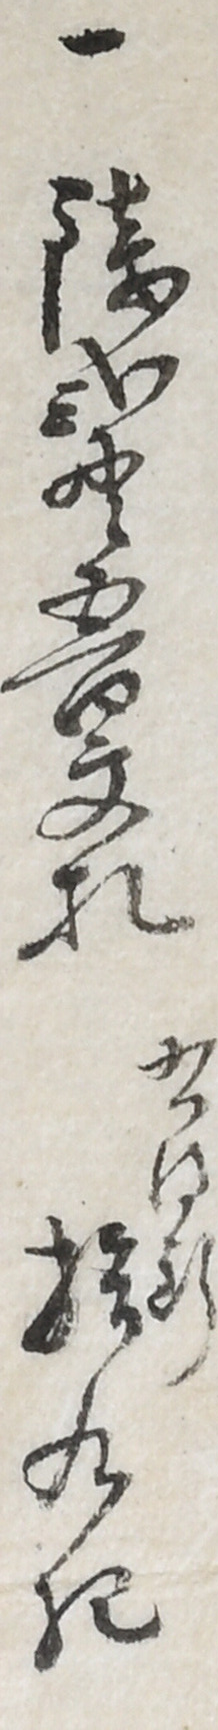一銭弐貫五百文札右同断拾九把
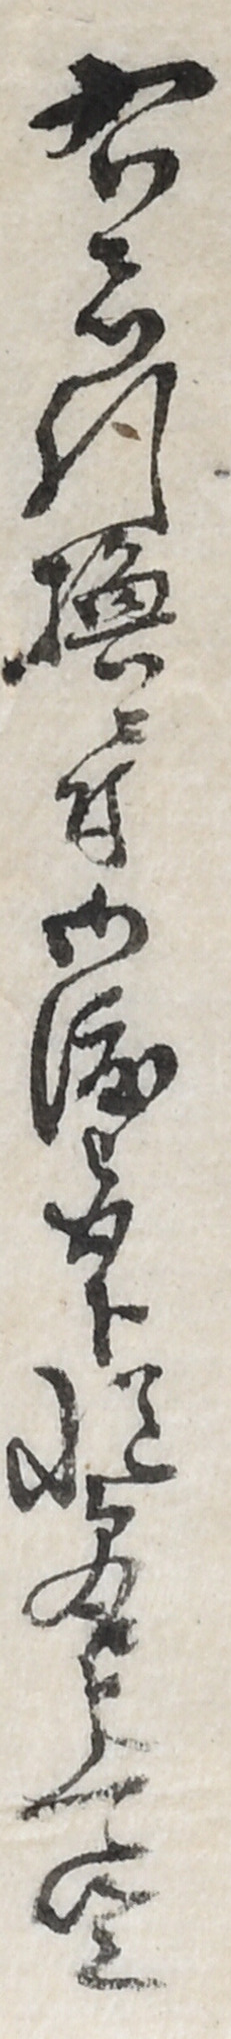右者引換ニ付御渡被為下慥受取申上候以上
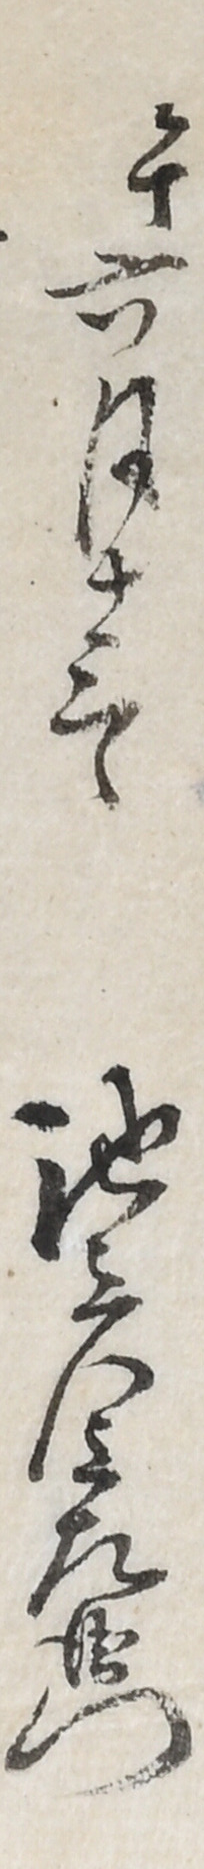午六月十三日池上金左衛門
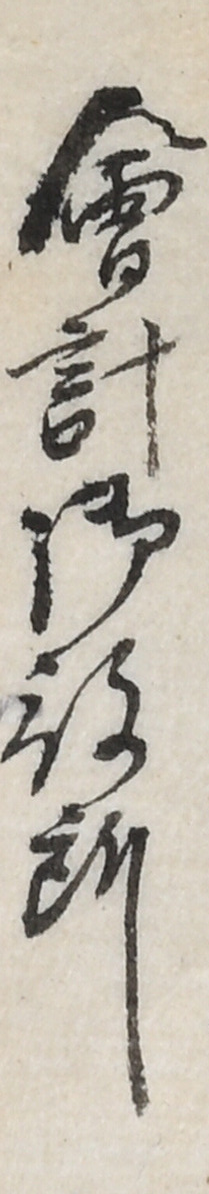会計御役所
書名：髙遠限楮幣引換ニ付御下ケ渡控
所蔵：伊那市立高遠町図書館・合同会社AMANE
